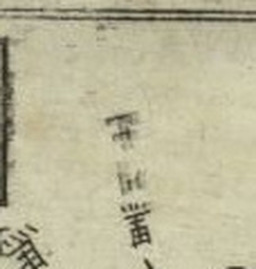黒川出
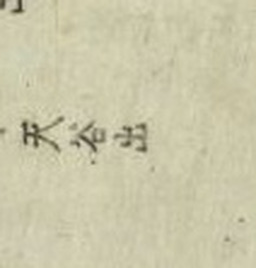天谷出
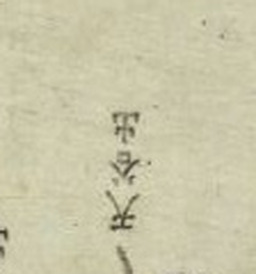天谷出
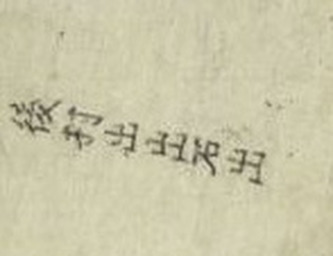後村出出石出
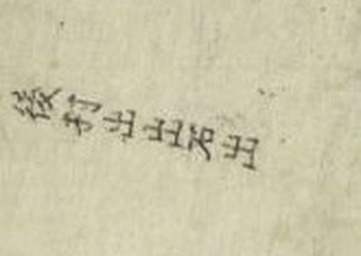後村出出石出
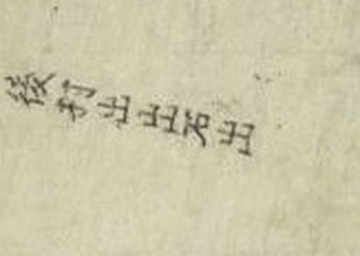後村出出石出
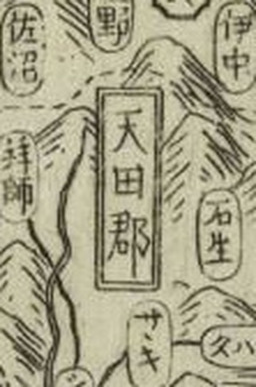天田郡
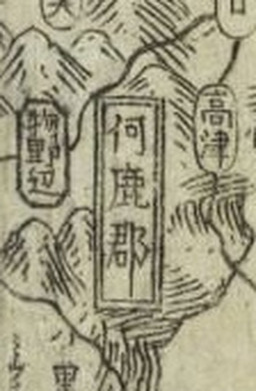何鹿郡
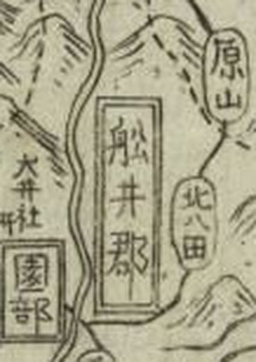舩井郡
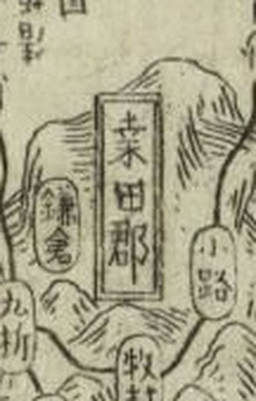天田郡
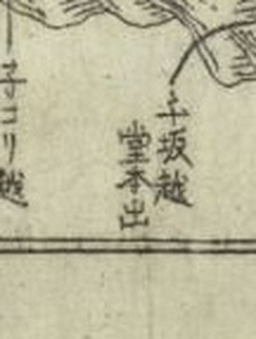堂本出
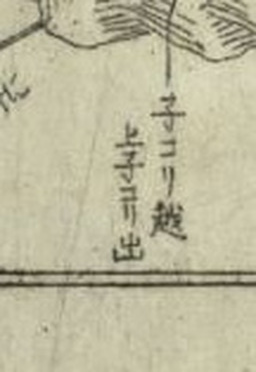上子こり出

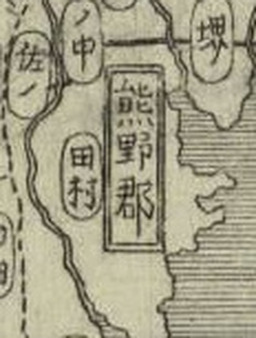熊野郡
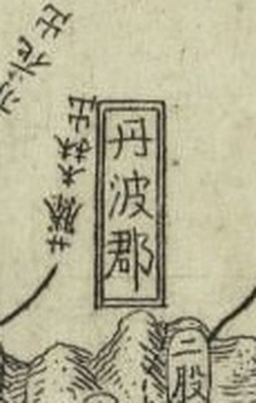丹波郡
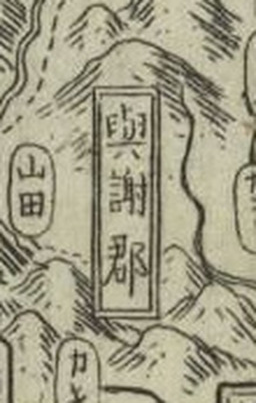與謝郡
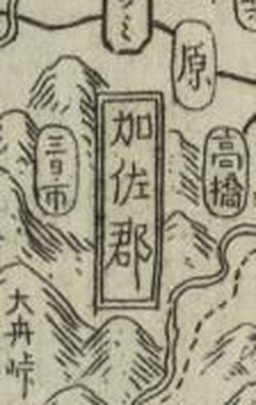加佐郡
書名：大日本国細図 西国之部 下
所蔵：University of the Ryukyus Library
